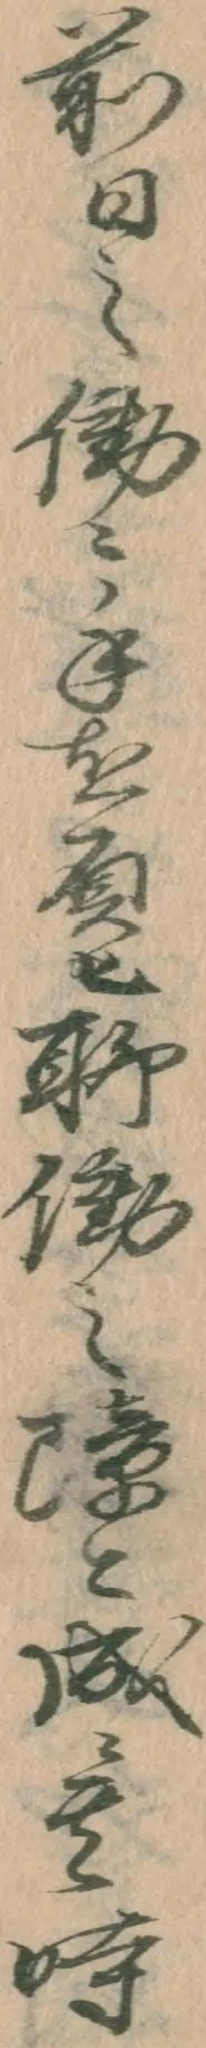前日之働に手を負ひ聊働之隙を成に其時
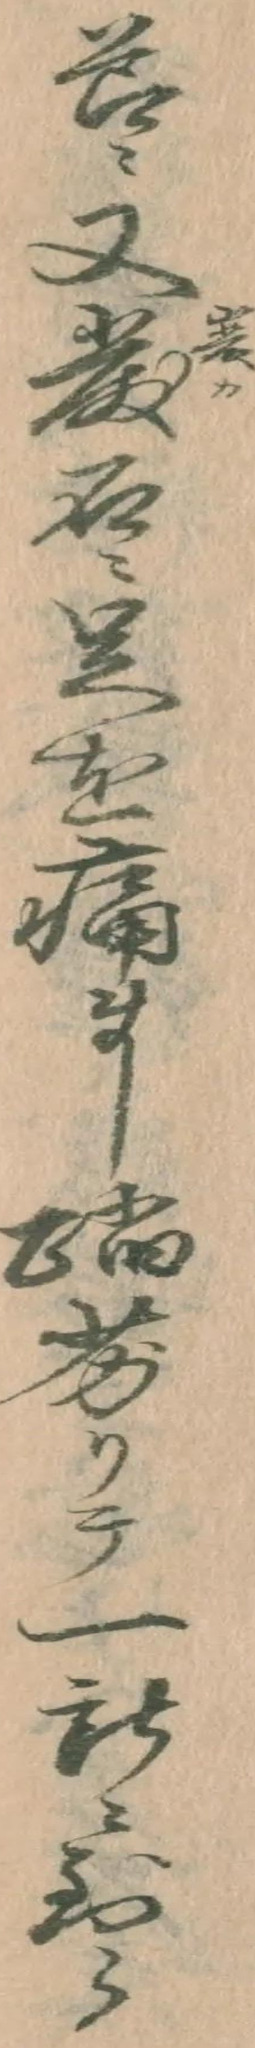節に又厳石に足を痛まし踏芬りて一所に至ら
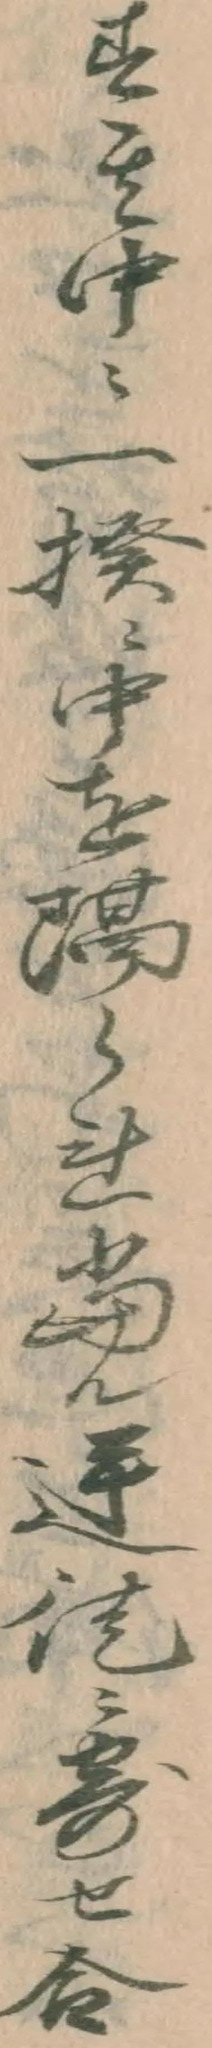春其中に一揆に中を隔り連当る逆徒に寄せ合
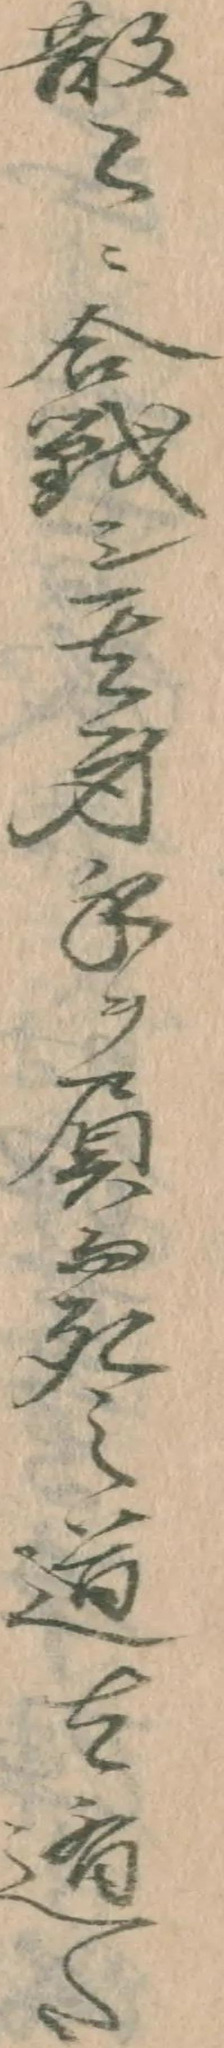散々に合戦し其身手を負而し死之道者逢た
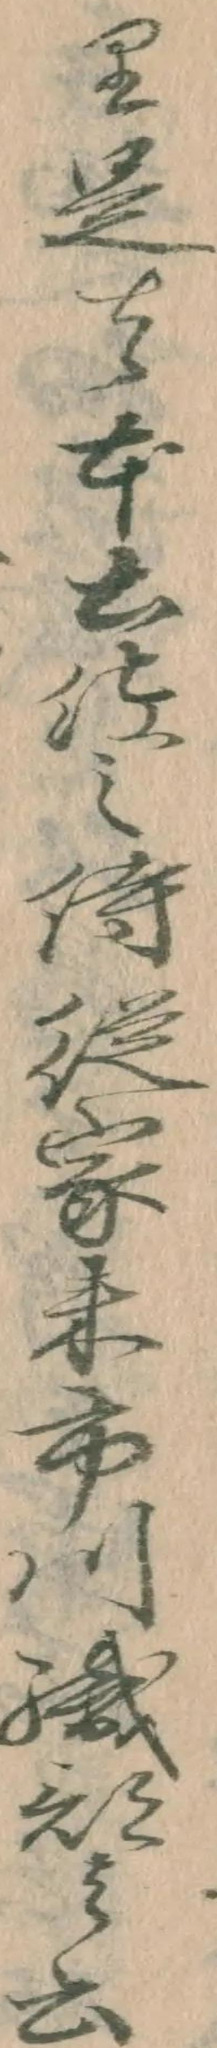里是者本土佐之侍従家来市川織部与云
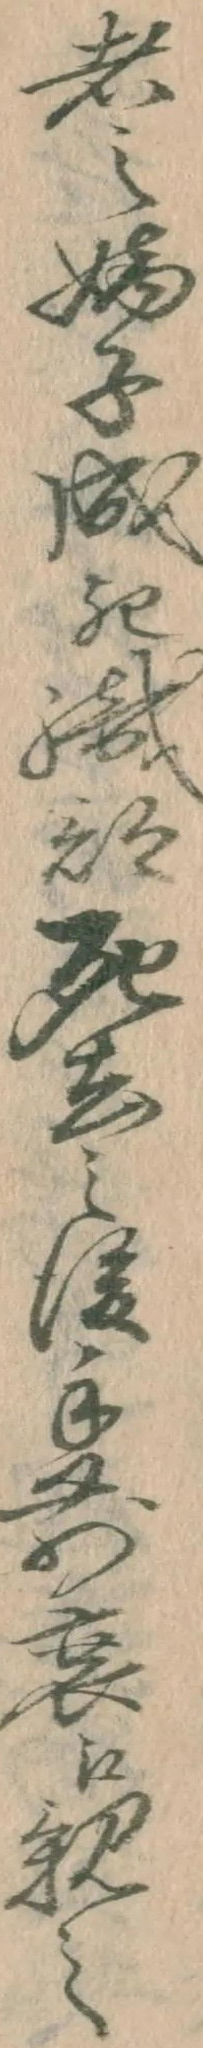者之嫡子成歟織部死去之後手前衰江親之
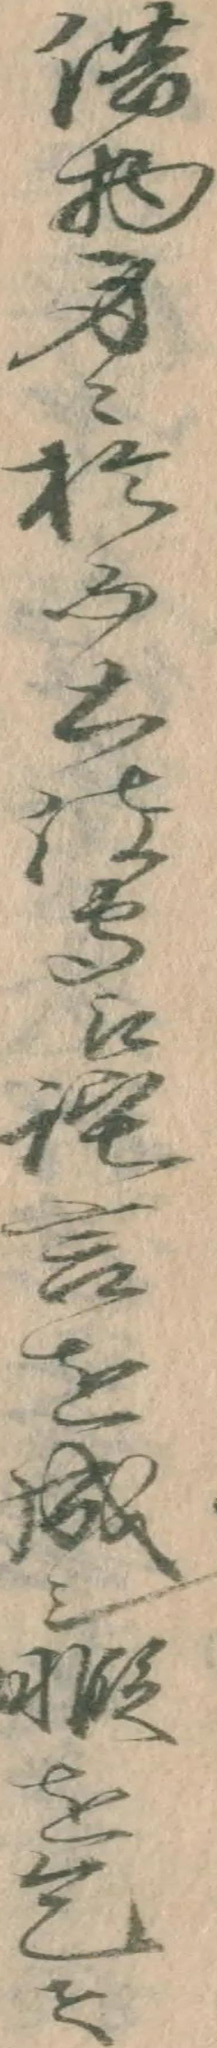借物身に於而土佐守江詫言を成し暇を乞て
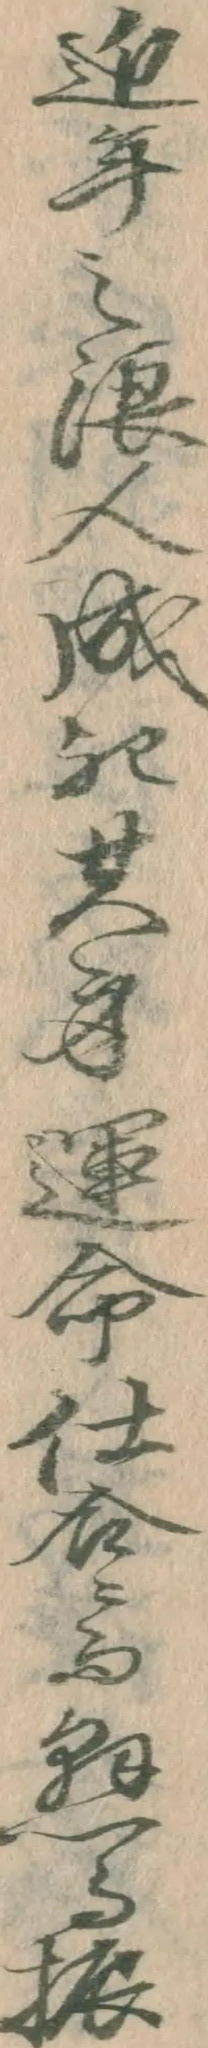近年之牢人成歟共身運命仕合に而懸る振
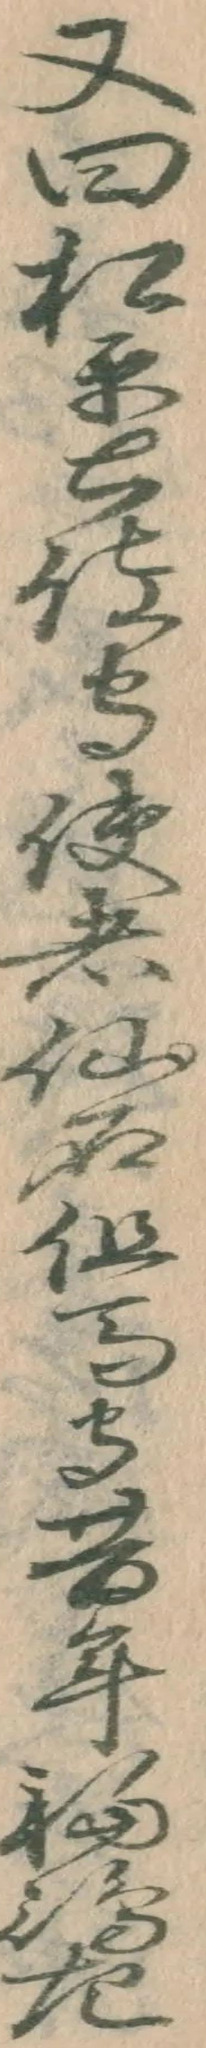又曰松平土佐守使共仙石但馬守昔年福島左
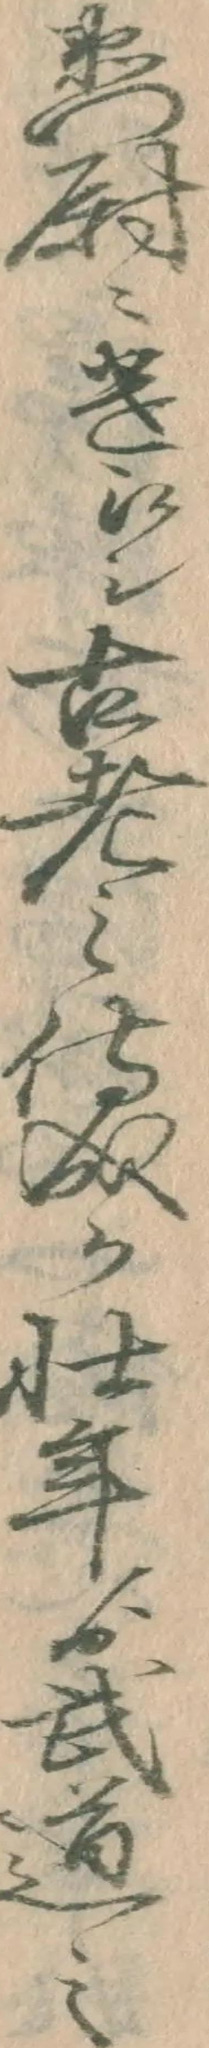衛門尉に遣江し古老之侍成か壮年ゟ武道之
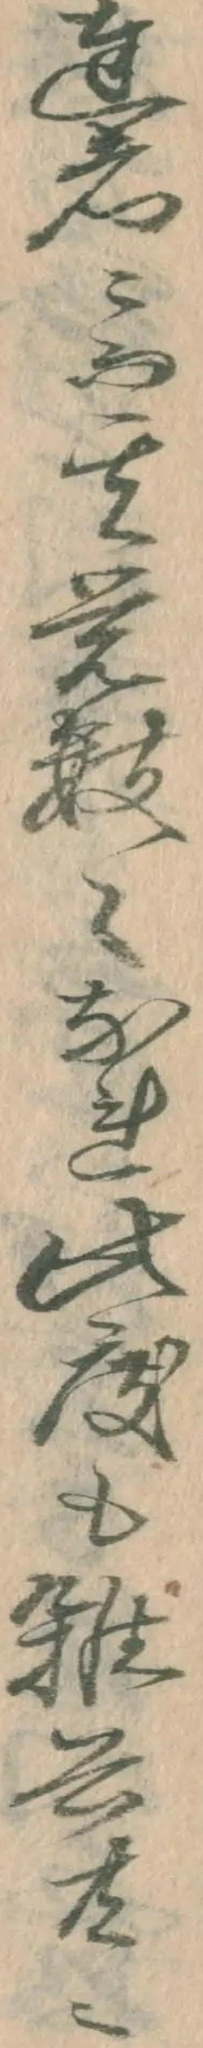達者に而其覚数々な連此度も雑兵共に

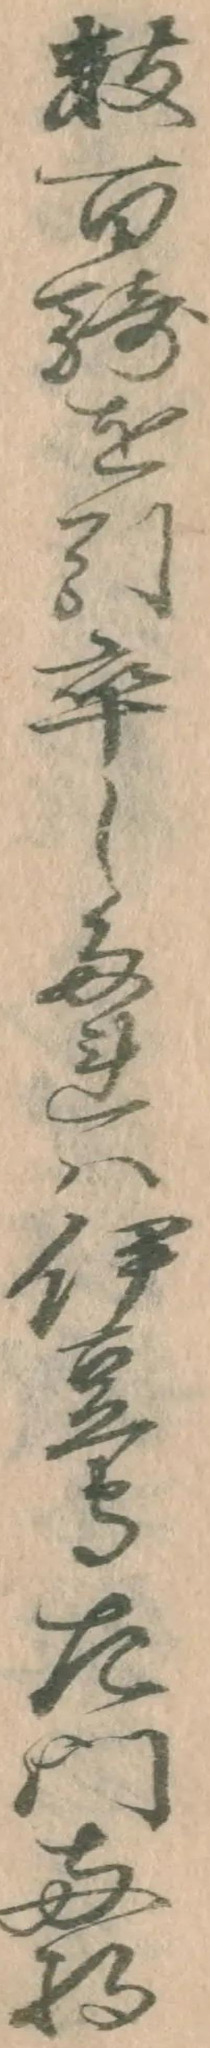数百騎を引卒し多連は伊豆守左門両将
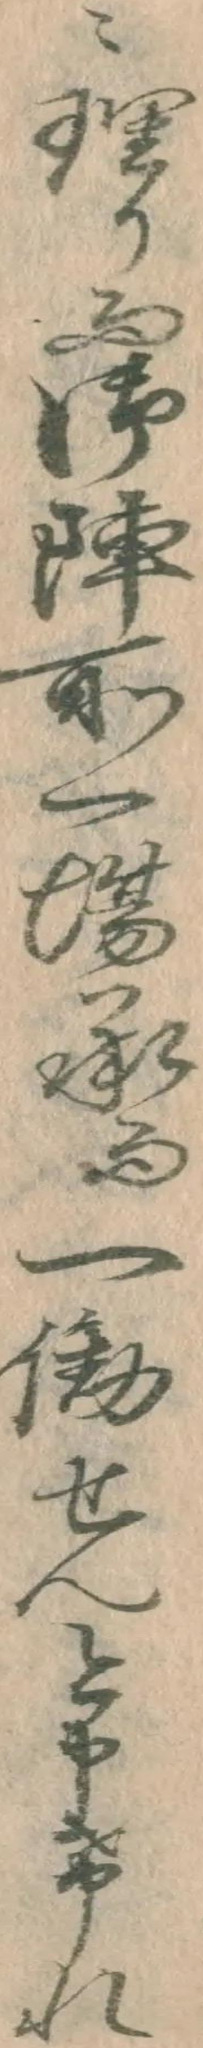に理り而御陣取一場承而一働せんと申希れ
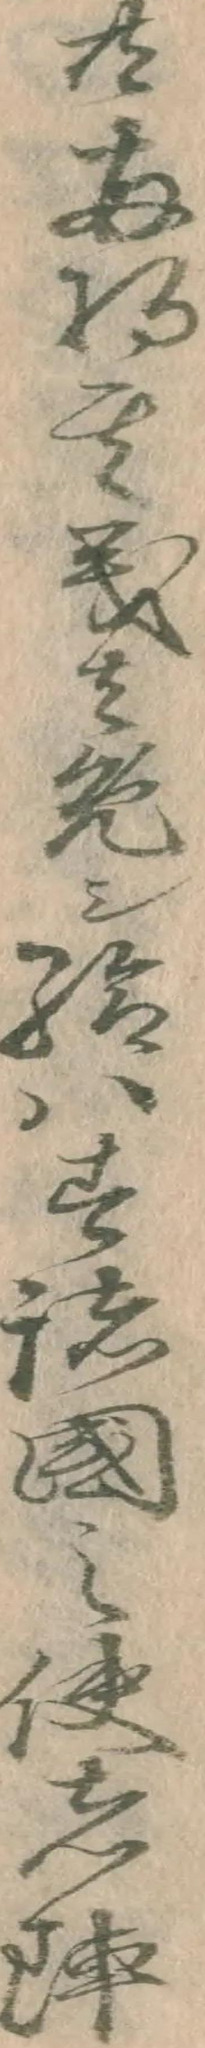共両将其義者免し給は春諸国之使者陣
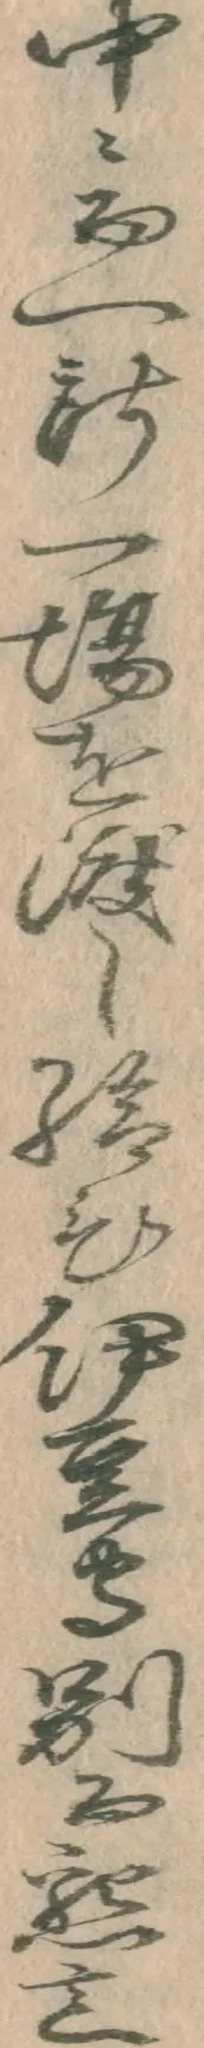中に而一新一場を渡し給ひ伊豆守別而懸意
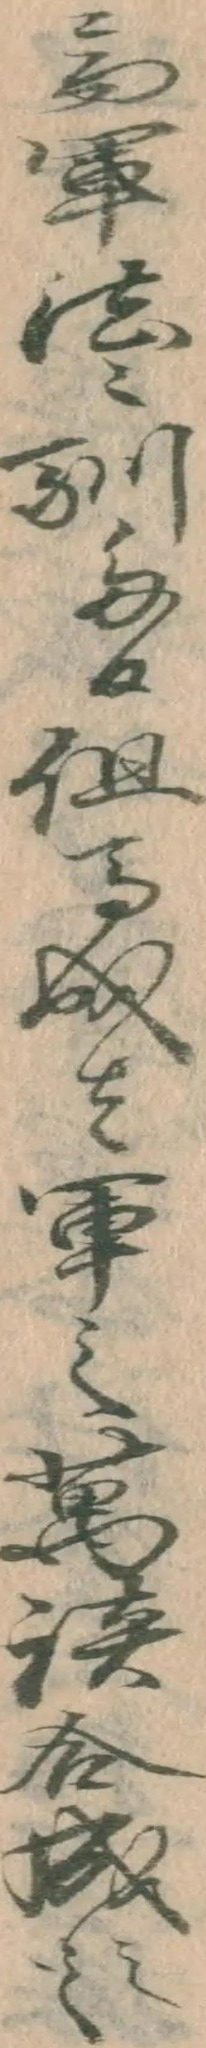に而軍法に馴多る但馬成者軍之万談合成之
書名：切支丹御退治記 49巻. [8]
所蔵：国立国会図書館 National Diet Library, JAPAN
